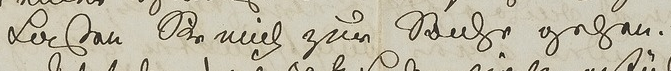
Laßen Sie mich zur Sache gehen.
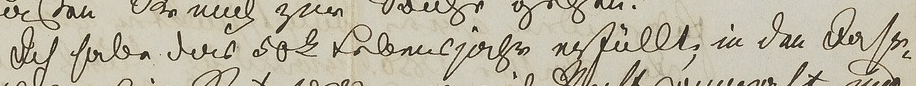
Ich habe das 50t Lebensjahr erfüllt; in den Jahr-
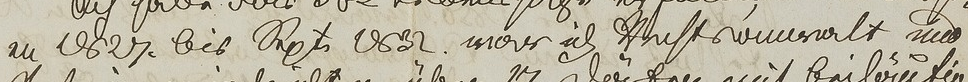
en 1827. bis Sept. 1832. war ich Rechtsanwalt und
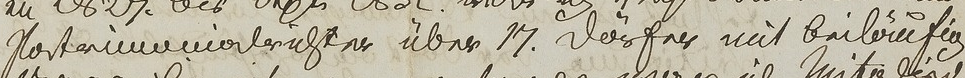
Patrimonialrichter über 17. Dörfer mit beiläufig
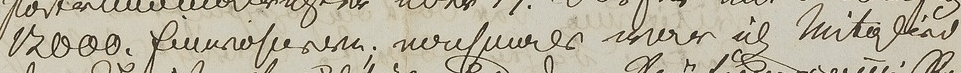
12000. Einwohnern; nachmals war ich Mitglied
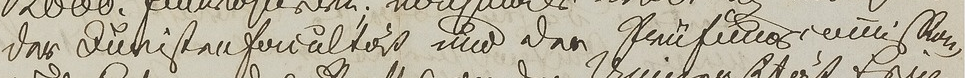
der Juristenfacultät und der Prüfungscommission,
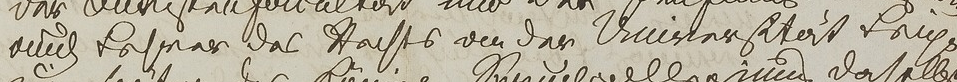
auch Lehrer des Rechts an der Universität Leip-
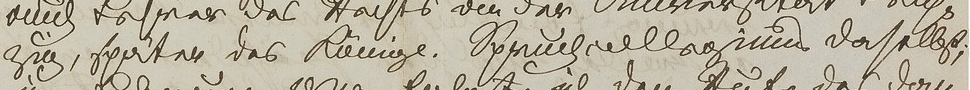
zig, später des Königl. Spruchcollegiums daselbst;
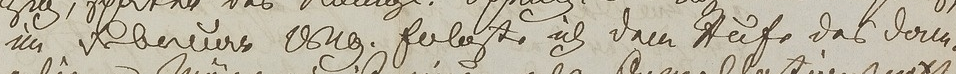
im Februar 1849. folgte ich dem Rufe des dam-
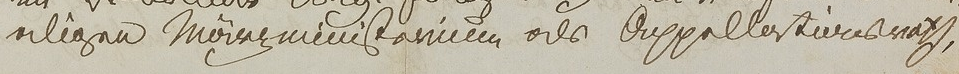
aligen Märzministerium als Appellationsrath,
